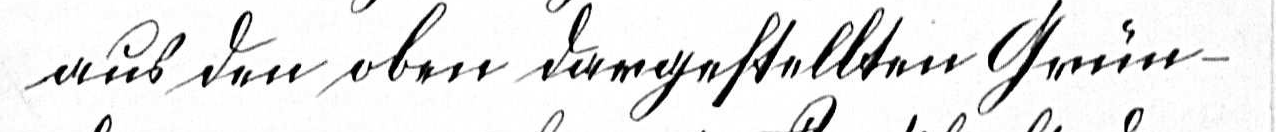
aus den oben dargestellten Grün¬
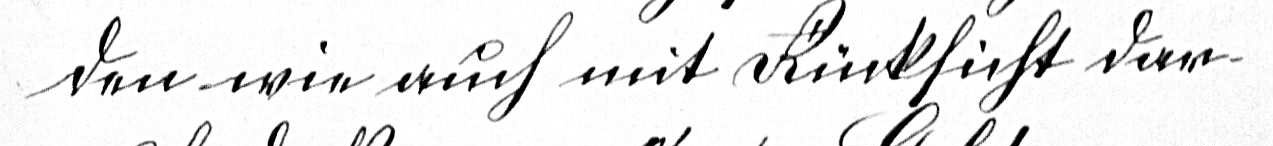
den wie auch mit Rücksicht dar¬
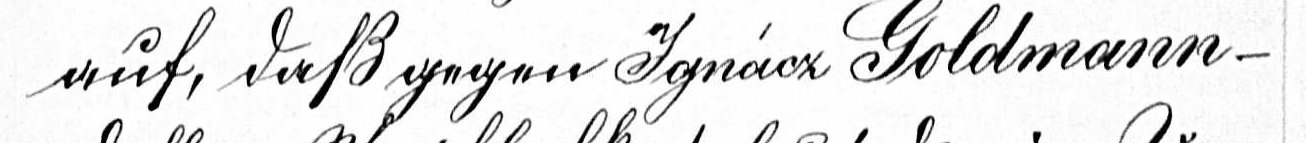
auf, daß gegen Jgnácz Goldmann-
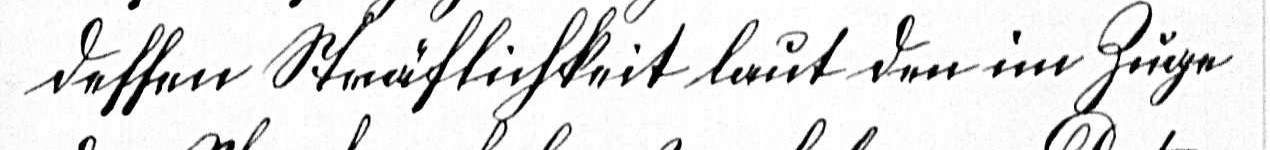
dessen Sträflichkeit laut den im Zuge
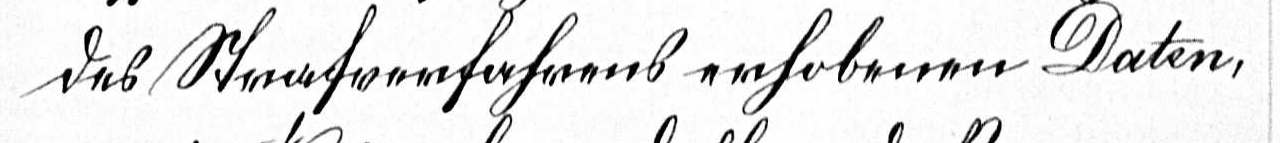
des Strafverfahrens erhobenen Daten,
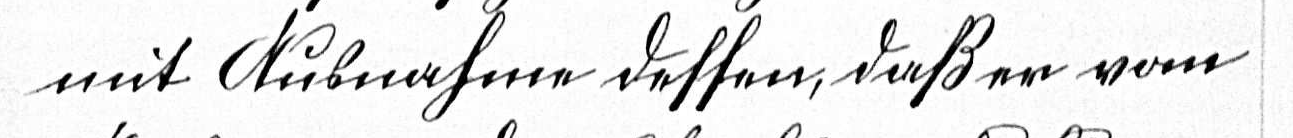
mit Ausnahme dessen, daß er vom
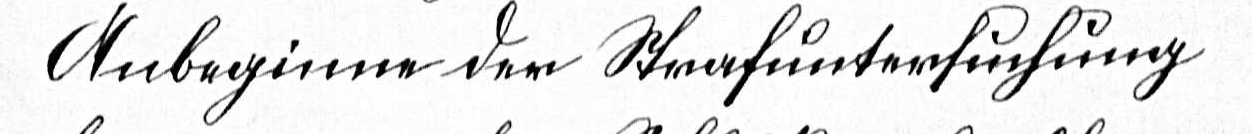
Anbeginne der Strafuntersuchung
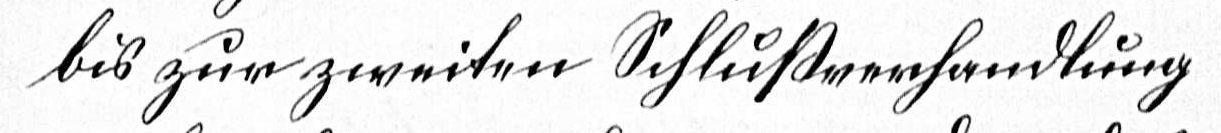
bis zur zweiten Schlußverhandlung
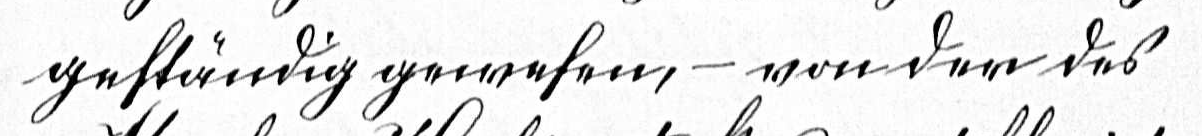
geständig gewesen,- von der des
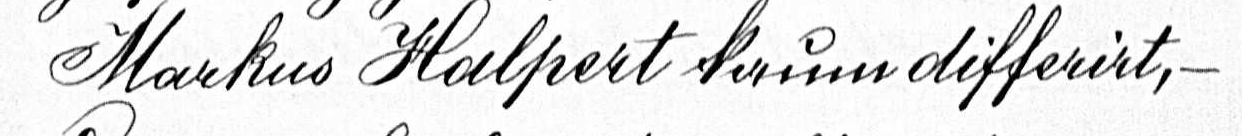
Markus Halpert kaum differirt,-
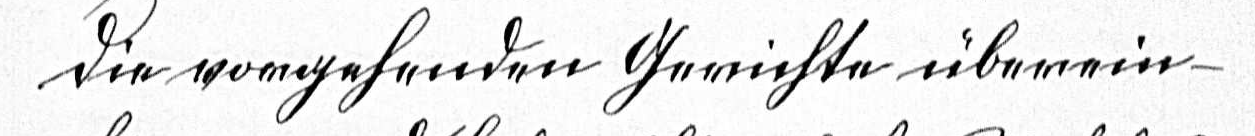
die vorgehenden Gerichte überein¬
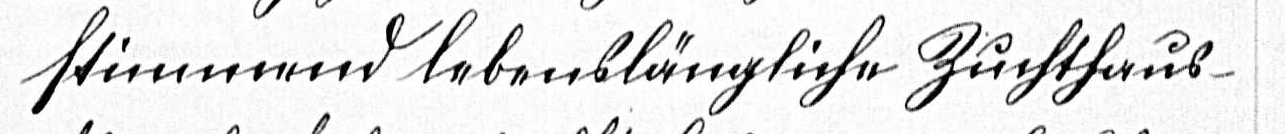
stimmend lebenslängliche Zuchthaus¬
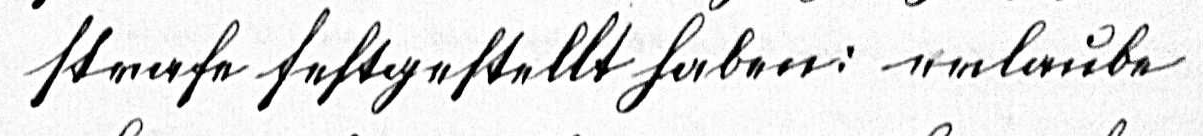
strafe festgestellt haben: erlaube
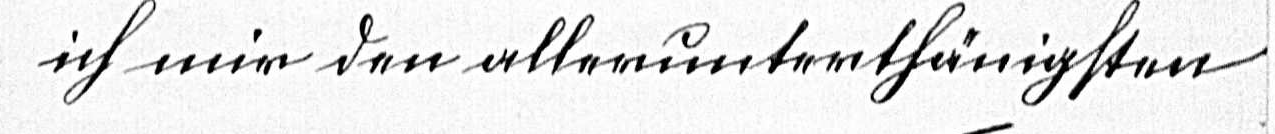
ich nur den allerunterthänigsten
